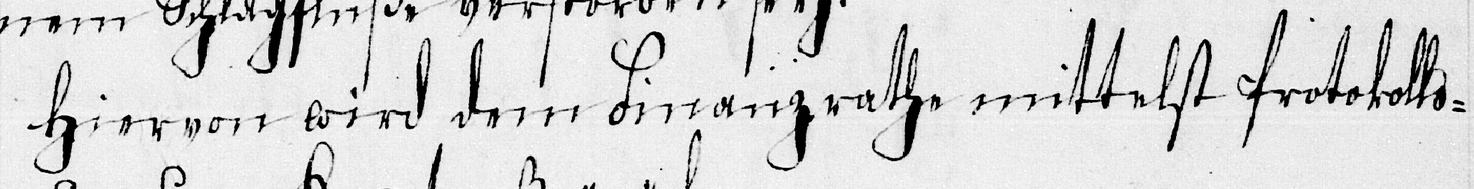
Hiervon wird dem Finanzrathe mittelst Protokoll¬
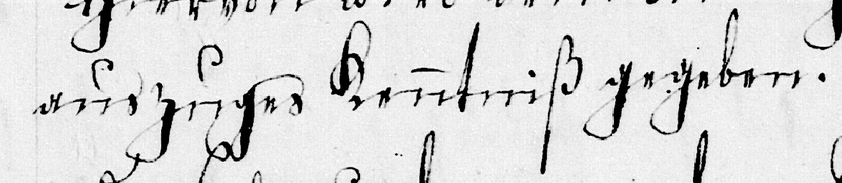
sauszuges Kenntniß gegeben.
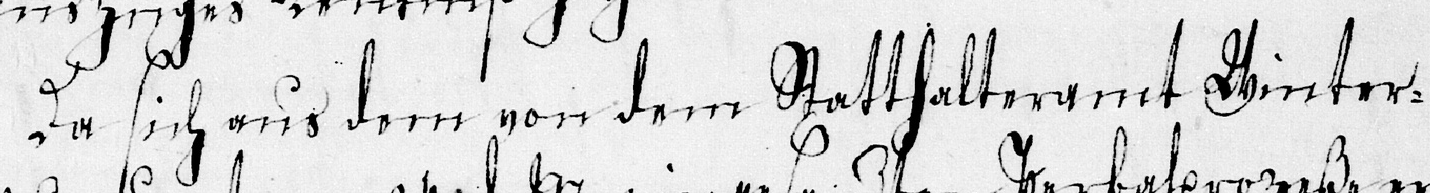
Da sich aus dem von dem Statthalteramt Winter¬
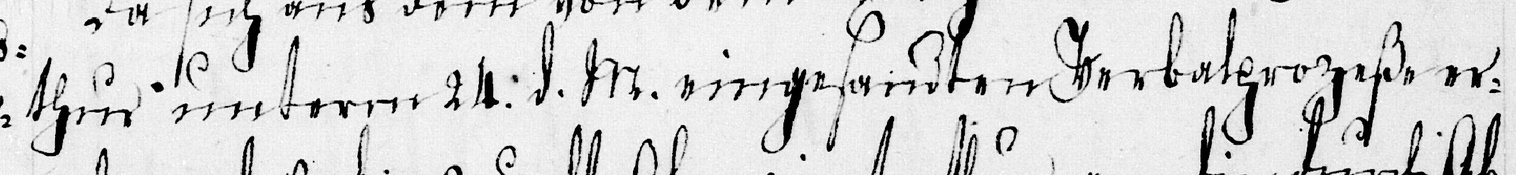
thur unterm 24. d. M. eingesandten Verbalprozeße er¬
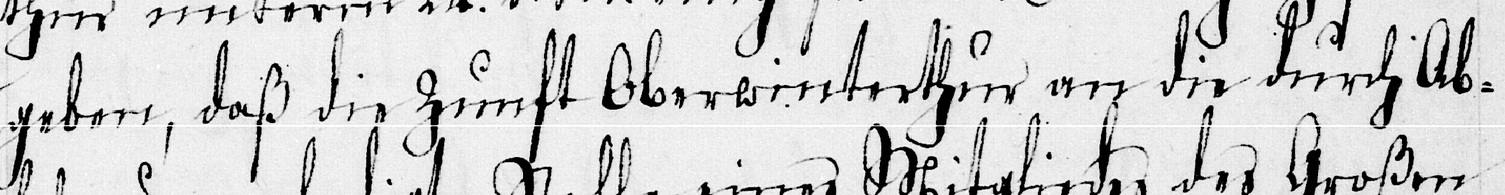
geben, daß die Zunft Oberwinterthur an die durch Ab¬
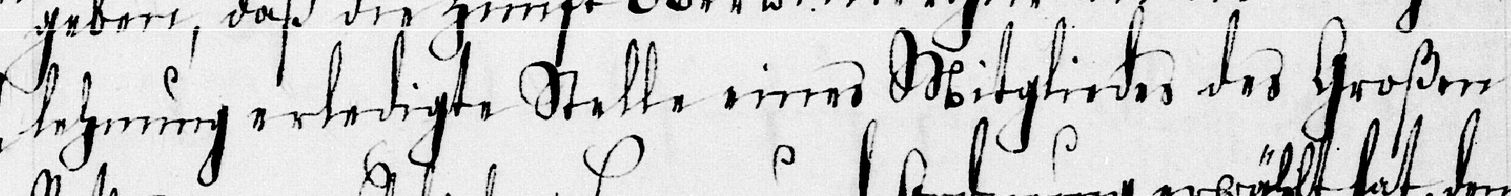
lehnung erledigte Stelle eines Mitgliedes des Großen
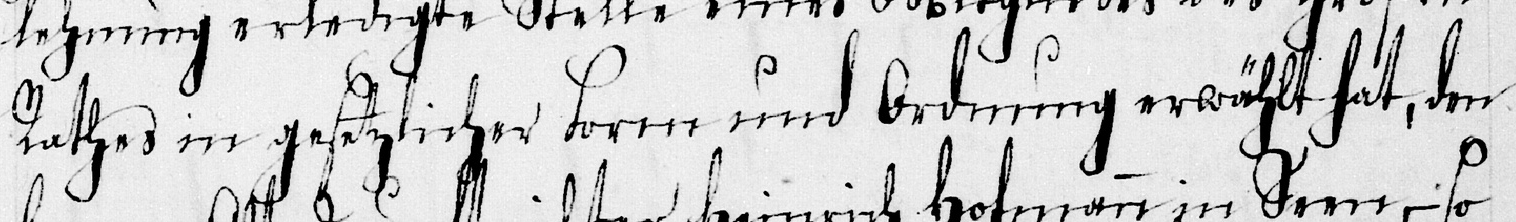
Rathes in gesetzlicher Form und Ordnung erwählt hat, den
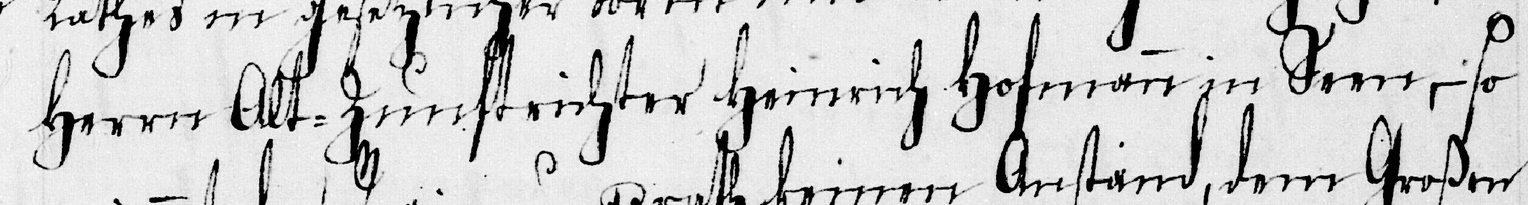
Herrn Alt-Zunftrichter Heinrich Hofmann in Seen, – so
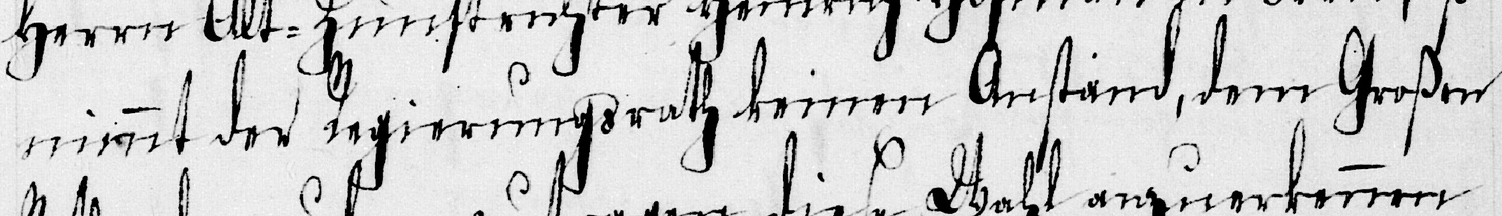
nimmt der Regierungsrath keinen Anstand, dem Großen
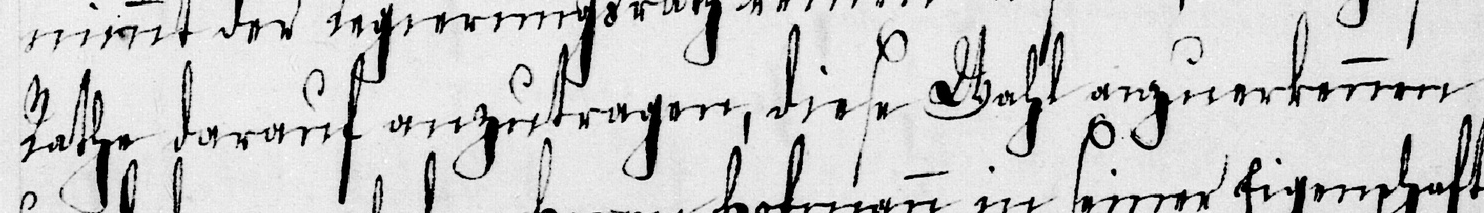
Rathe darauf anzutragen, diese Wahl anzuerkennen
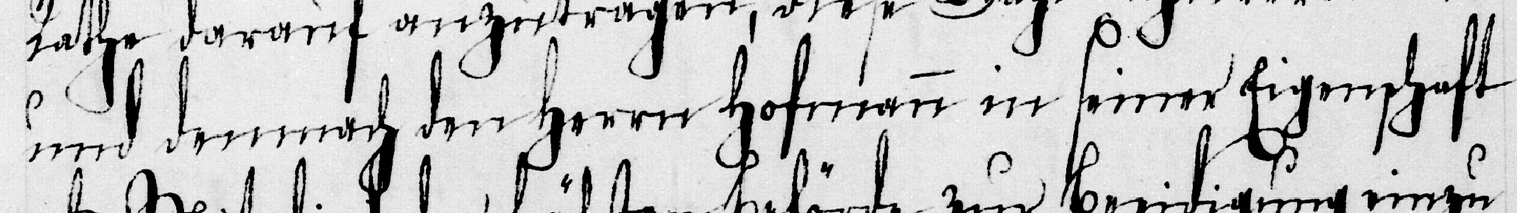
und demnach den Herrn Hofmann in seiner Eigenschaft
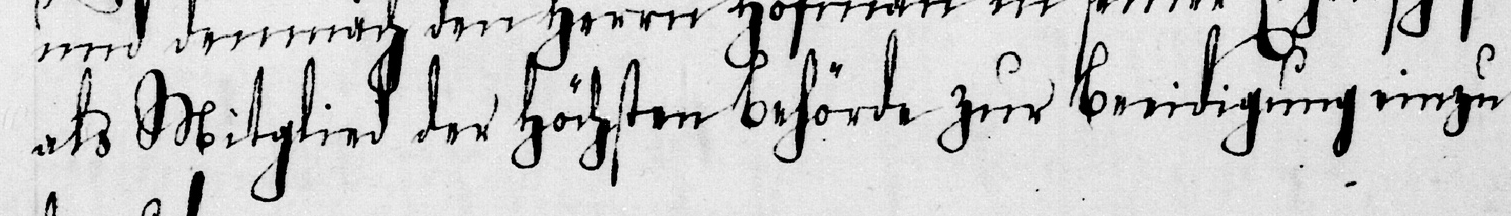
als Mitglied der höchsten Behörde zur Beeidigung einzu¬
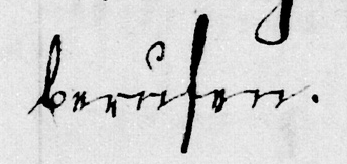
berufen.
